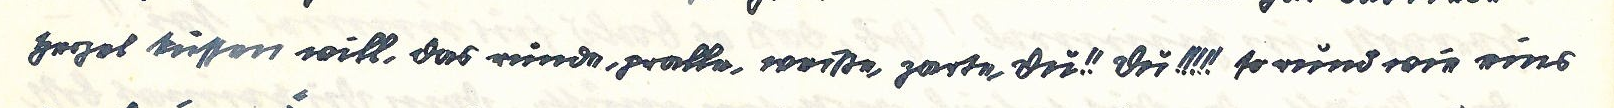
Herzel küssen will, das runde, pralle, weiße, zarte, Du!! Du!!!!! so rund wie eine
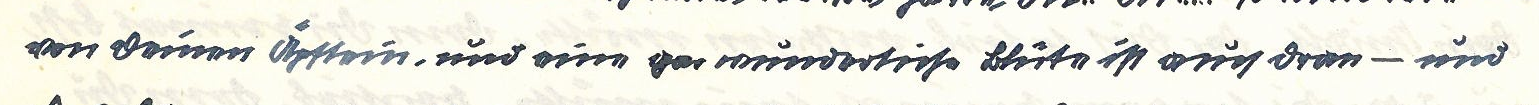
von Deinen Äpflein, und eine gar wunderliche Blüte ist auch dran – und
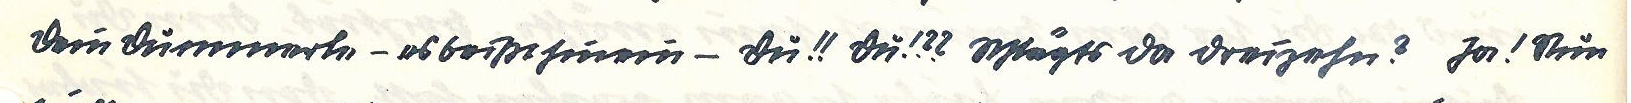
Dein Dummerle – er beißt hinein – Du!! Du!?? Schlägts da dreizehn? Ja! Nun
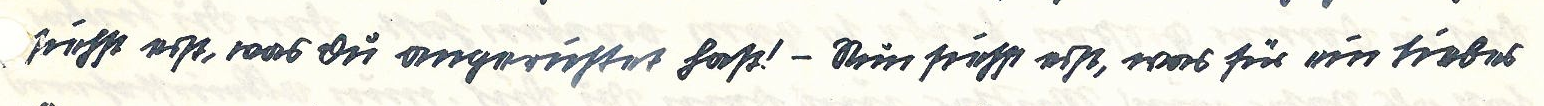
ehst erst, was Du angerichtest hast! – Nun siehst erst, was für ein liebes
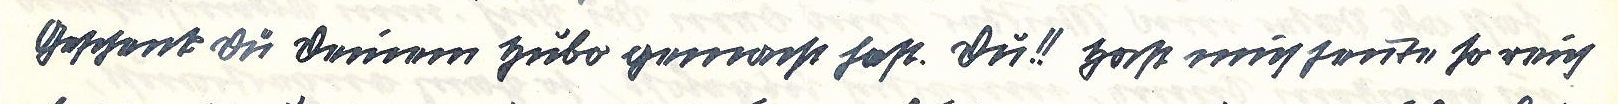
Geschenk Du Deinem Hubo gemacht hast. Du!! Hast mich heute so reich
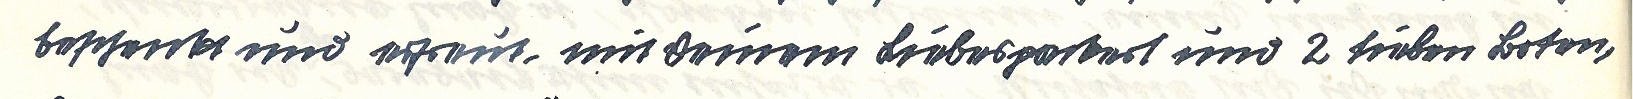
beschenkt und erfreut, mit Deinem Liebespaket und 2 lieben Boten,
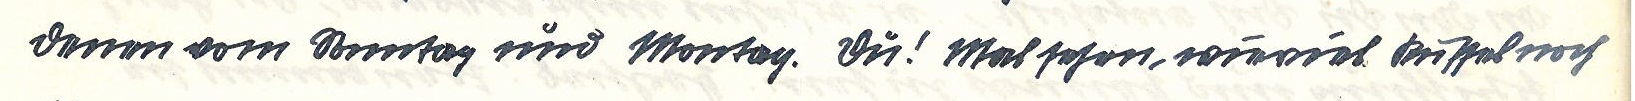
denen vom Sonntag und Montag. Du! Mal sehen, wieviel Kussel noch
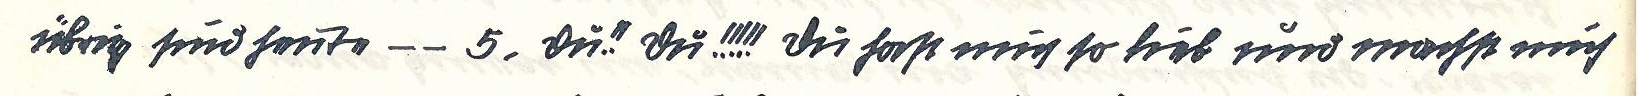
übrig sind heute – – 5, Du!! Du!!!!! Du hast mich so lieb und machst mich
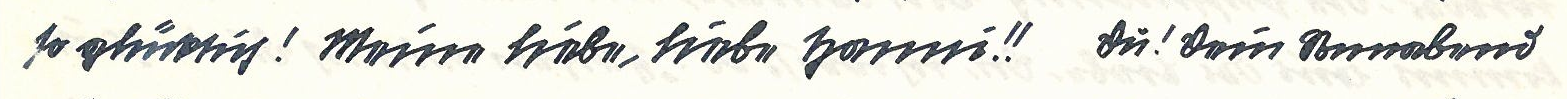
so glücklich! Meine liebe, liebe!! Du! Dein Sonnabend
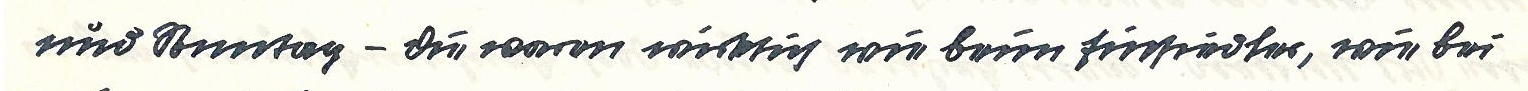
und Sonntag – die waren wirklich wie beim Einsiedler, wie bei
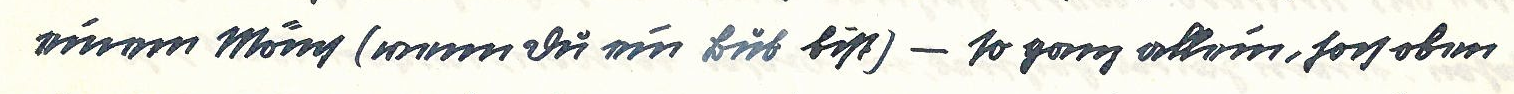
einem Mönch (wenn Du ein Bub bist) – so ganz allein, fast oben
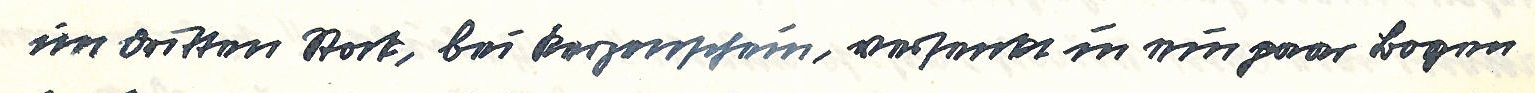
im dritten Stock, bei Kerzenschein, versenkt in ein paar Bogen
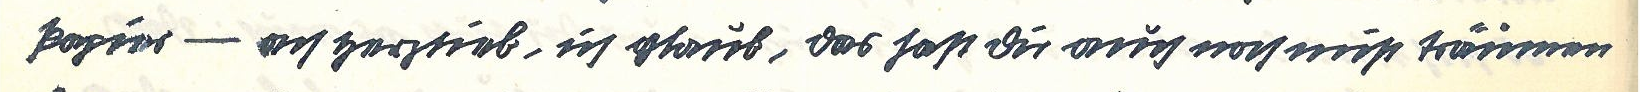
Papier – ach Herzlieb, ich glaub, das hast Dir auch nicht träumen
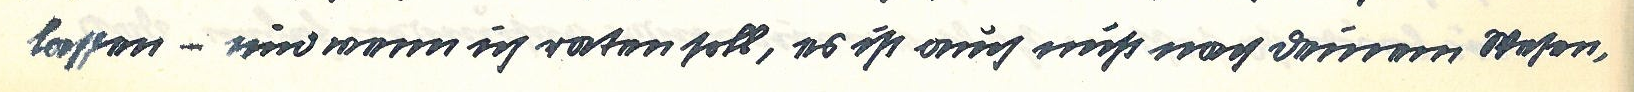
lassen – und wenn ich raten soll, es ist auch nicht nach Deinem Wesen,
